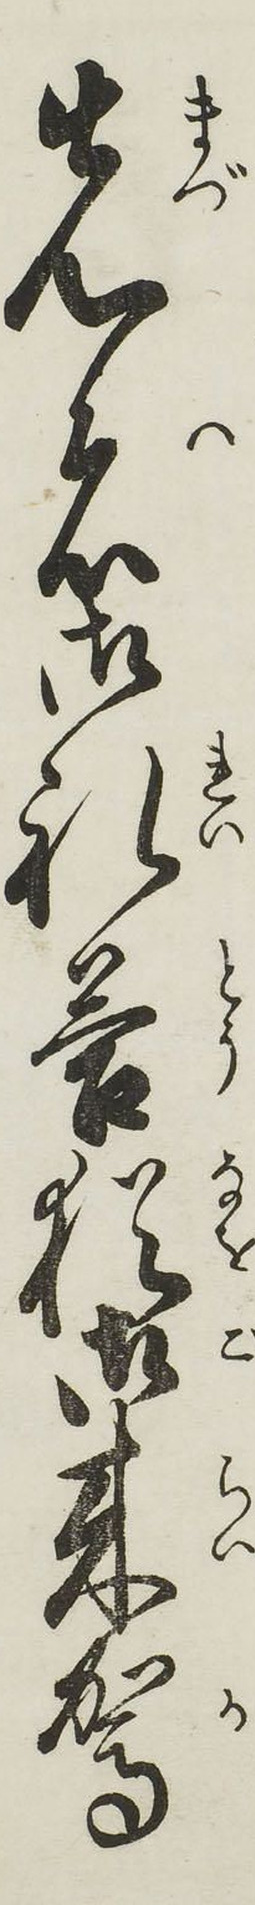先者御礼答猶御来駕
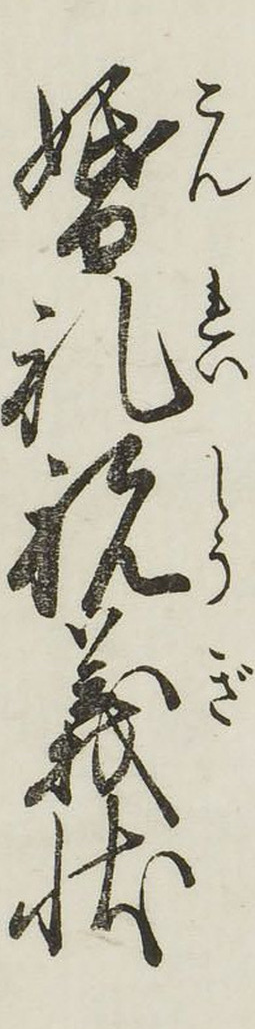婚礼祝義状

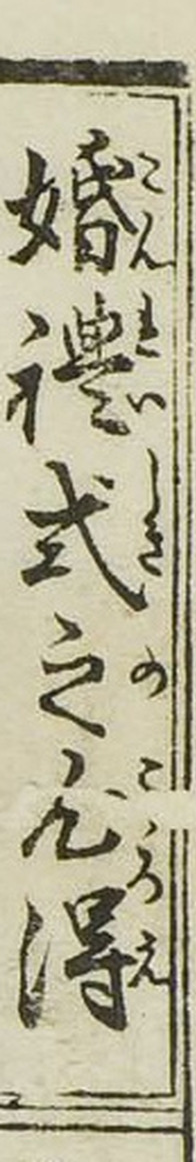婚礼式之心得
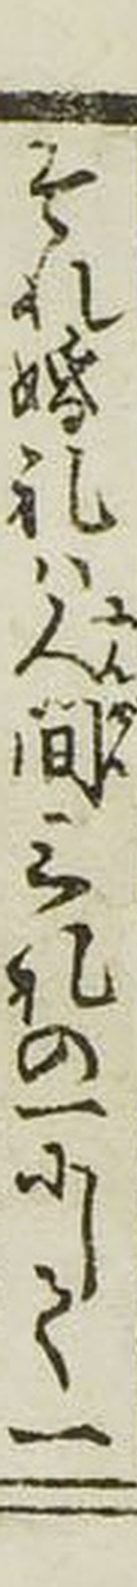それ婚礼は人間三礼の一にして一
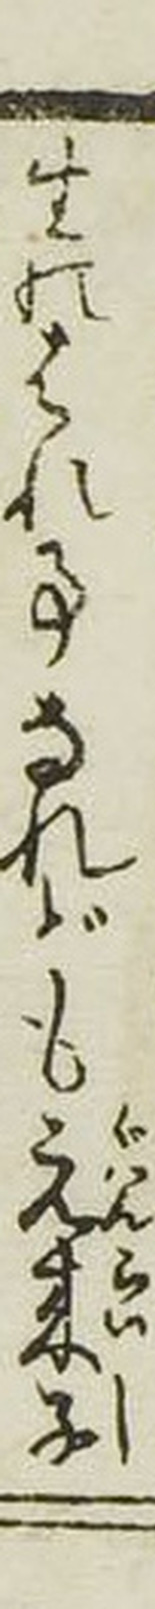生のはれ事なれども元来子
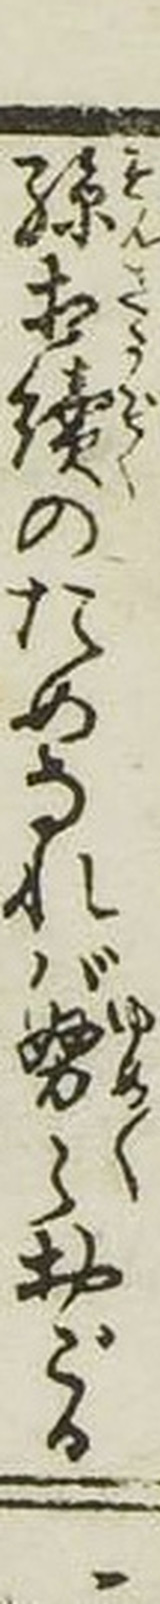孫相続のためなれば努々おごる
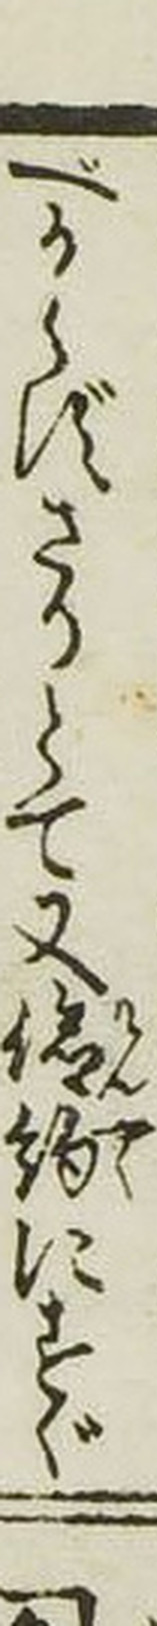べからずさりとて又倹約にすぐ
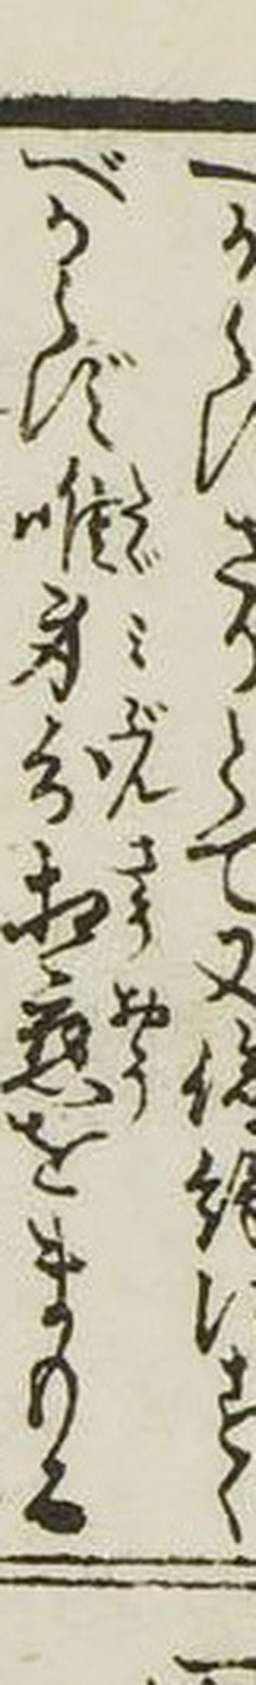べからず唯身分相応をまもる
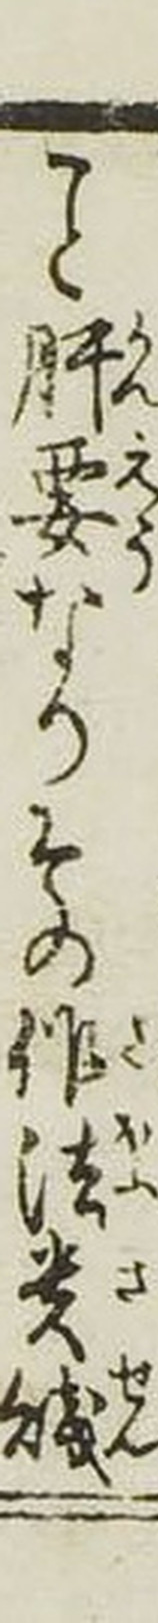こと肝要なりその作法貴賤
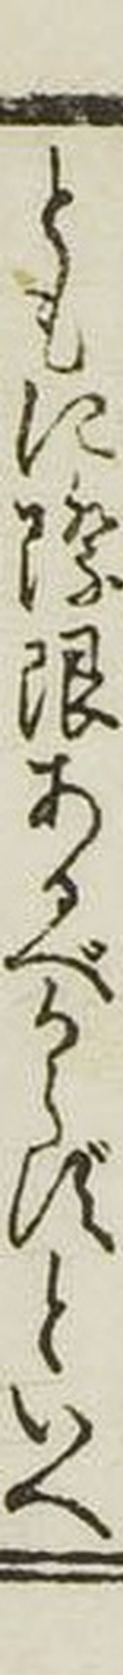ともに際限あるべからずといへ
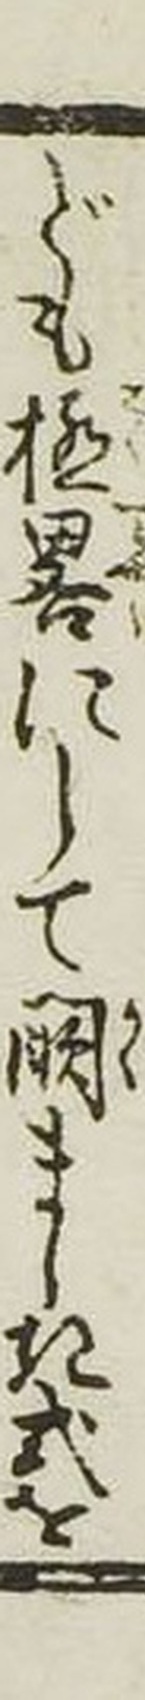ども極略にして闕ましき式を
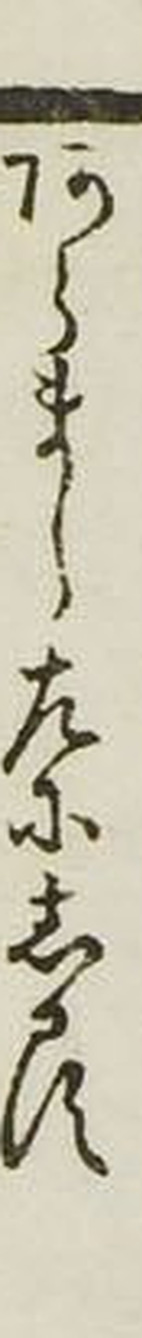あらまし左にしるす
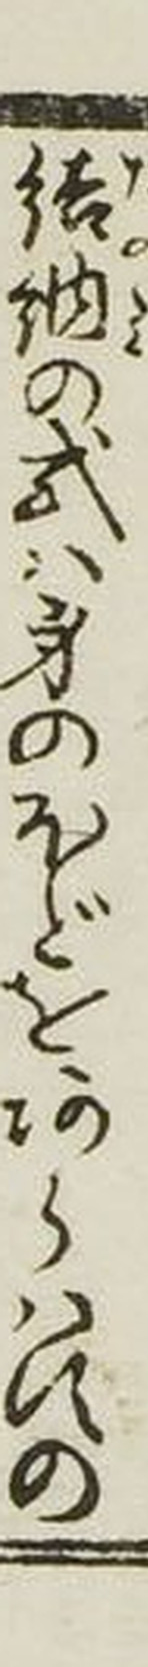結納の式は身のほどをあらはすの
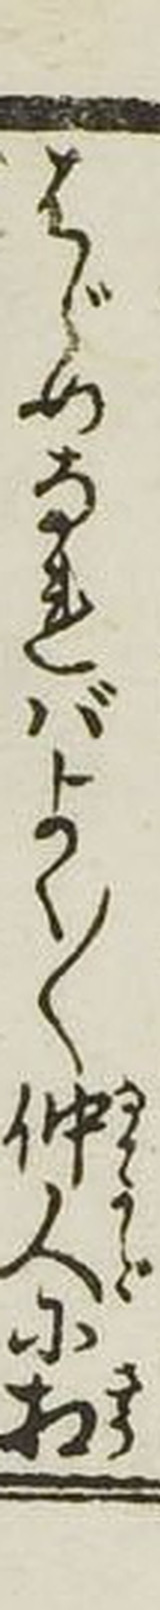はじめなればよく〳〵仲人に相
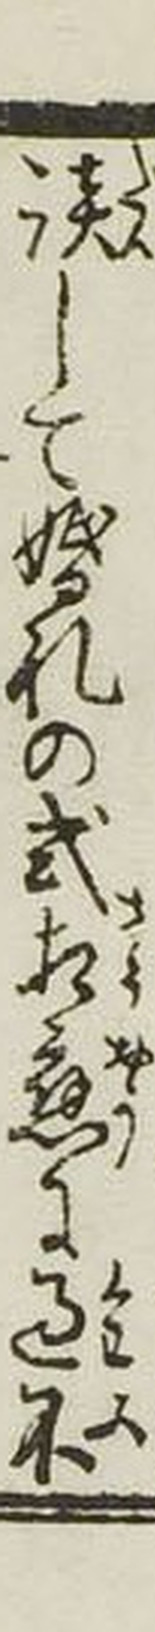談して婚礼の式相応に過不
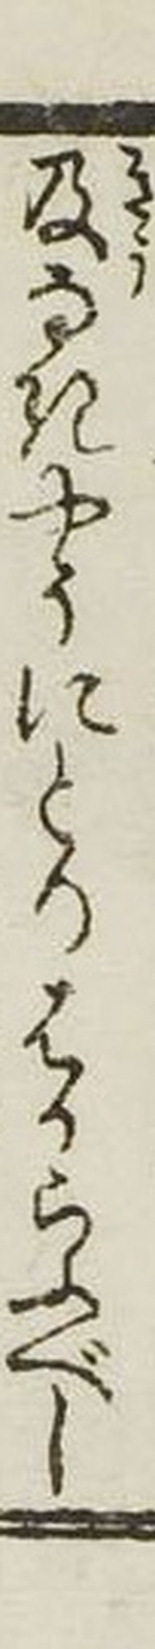及なきやうにとりはからふべし
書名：商人書翰便覧
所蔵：東京学芸大学教育コンテンツアーカイブ
